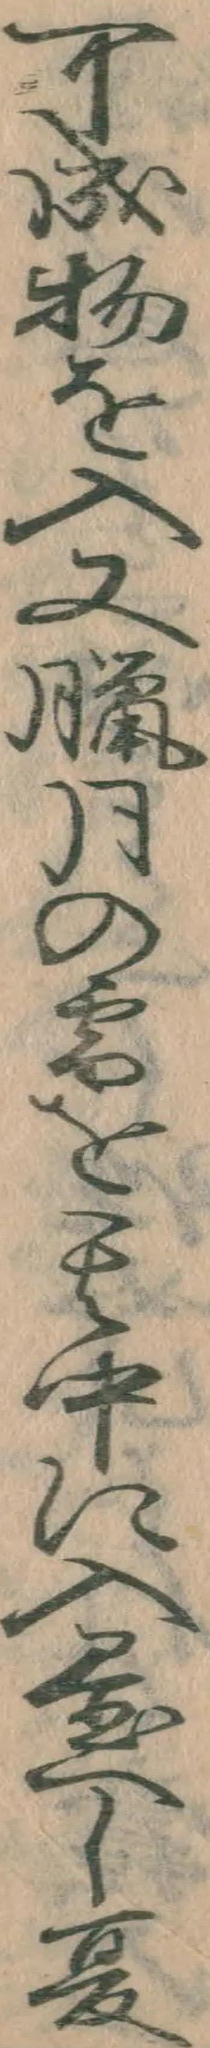可成物を入又臘月の雪を其中に入置へし夏
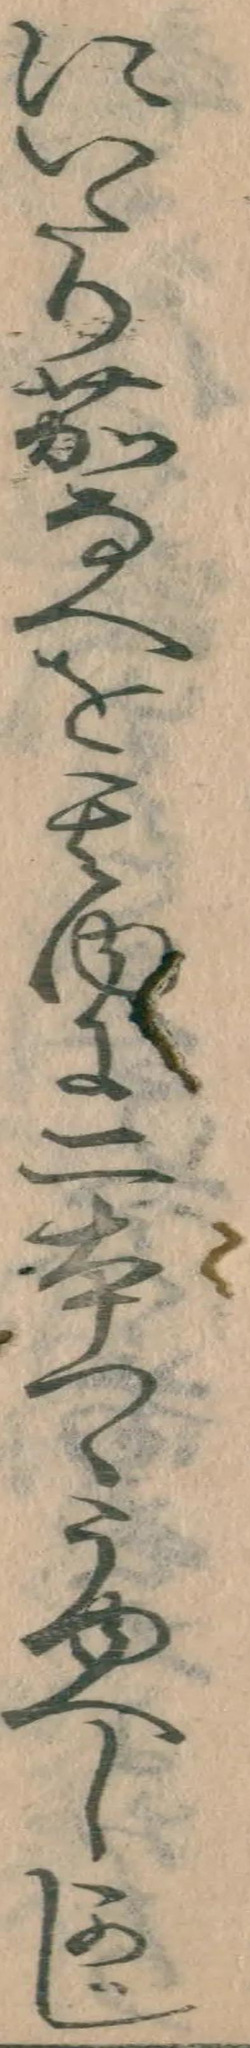にいたり茄なへを其内に二本つゝうゆへしかじ
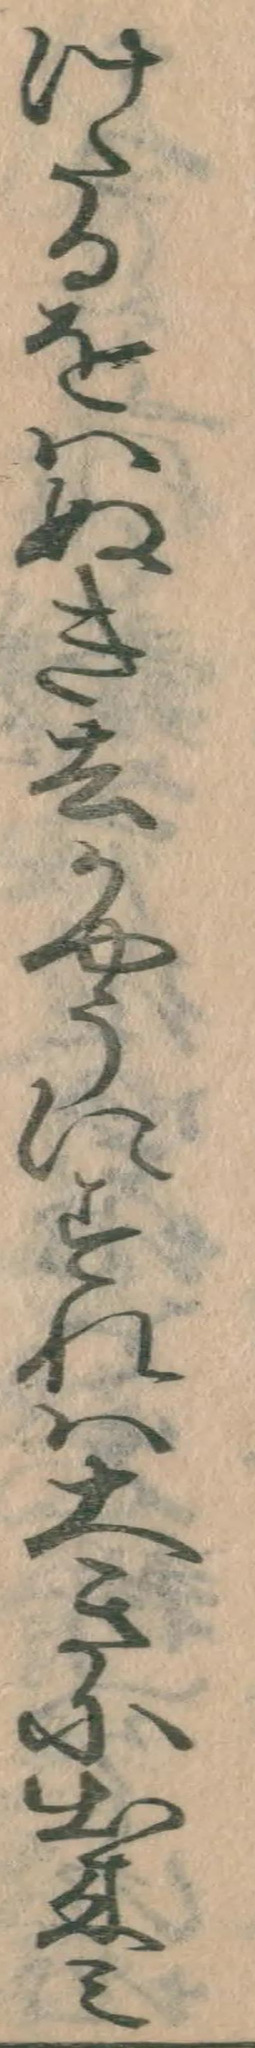けたるをはぬき去かやうにすれは大きに出来み
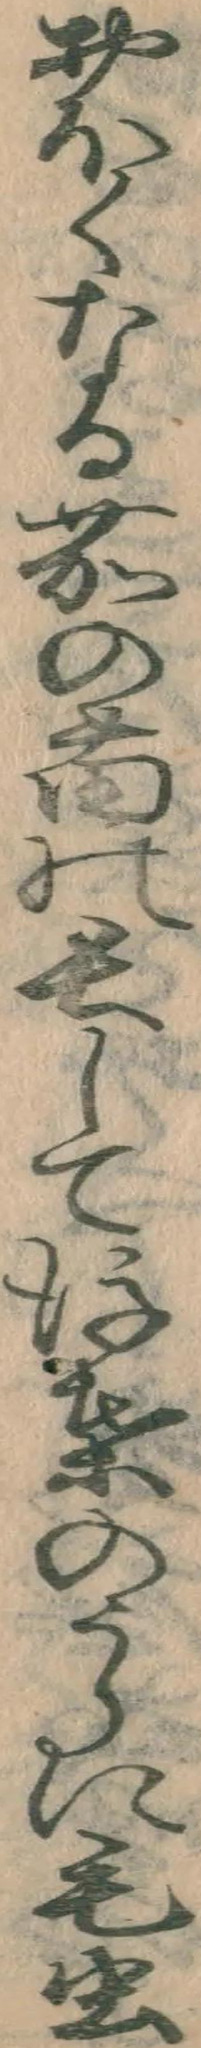おほくなる茄の苗の長して後葉のうらに毛虫
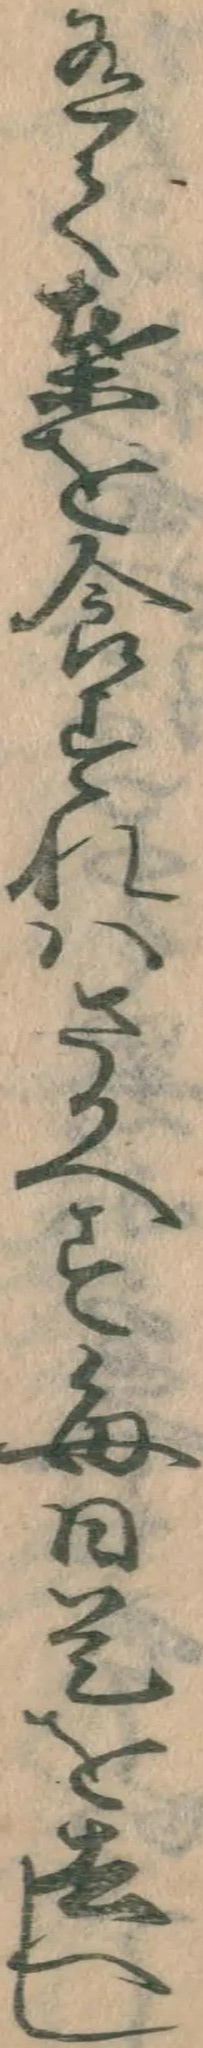あり有て葉を食すれはさかへす毎日是を去へし
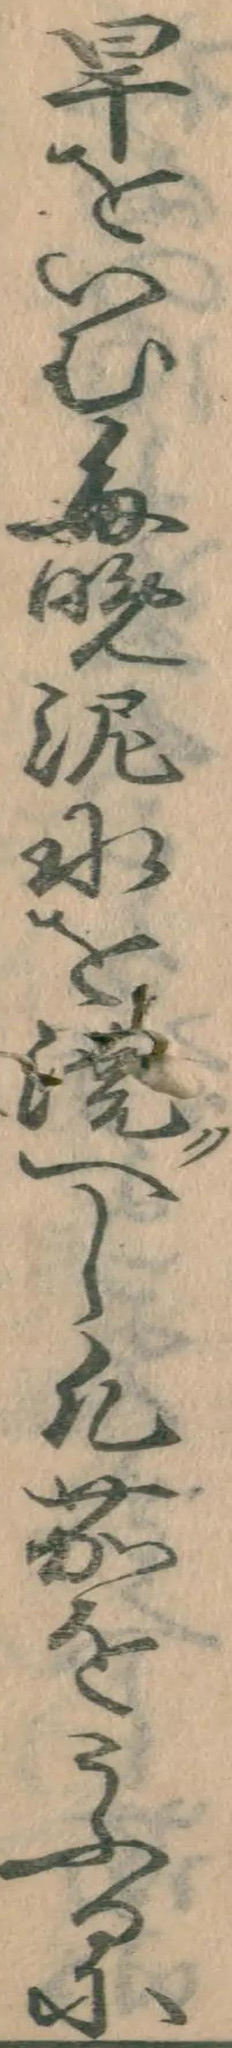旱をいむ毎晩泥水を澆くへし凡茄をう

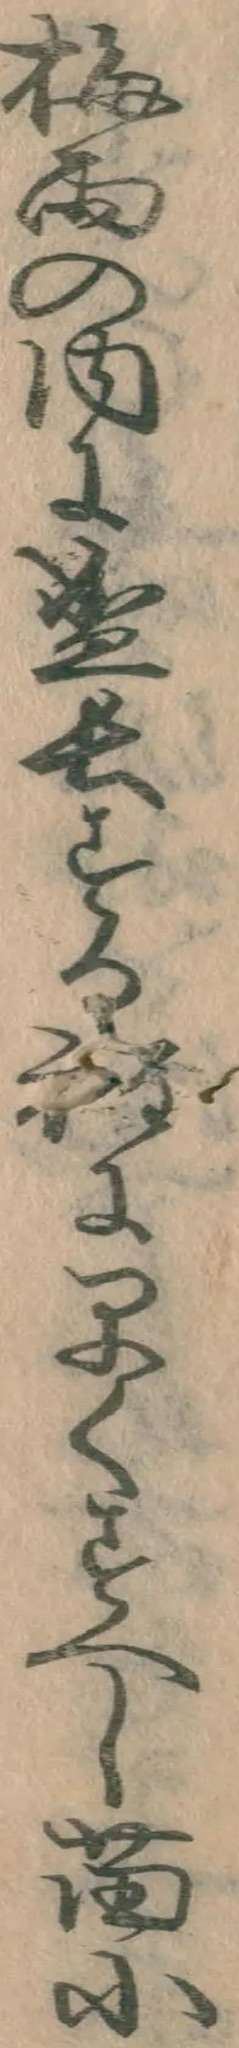梅雨の内に盛長する程に早くすへし苗に
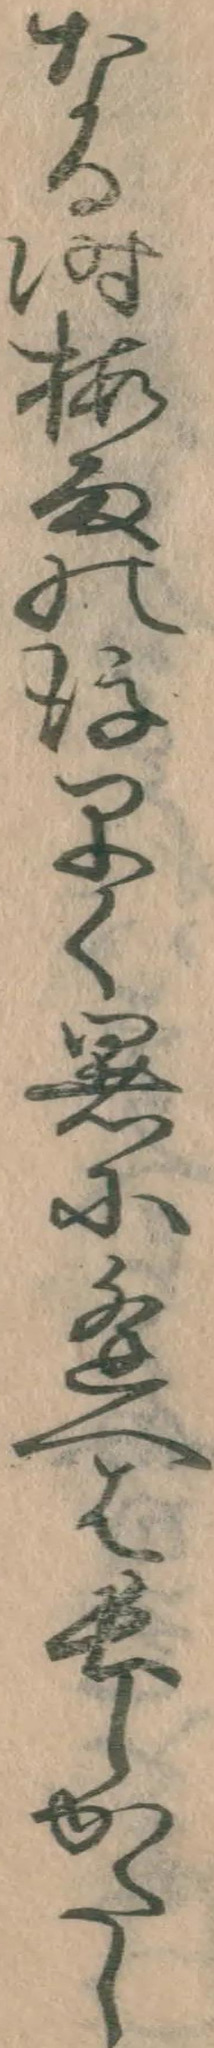なる時梅雨の後に早く暑に逢へは長しかたし
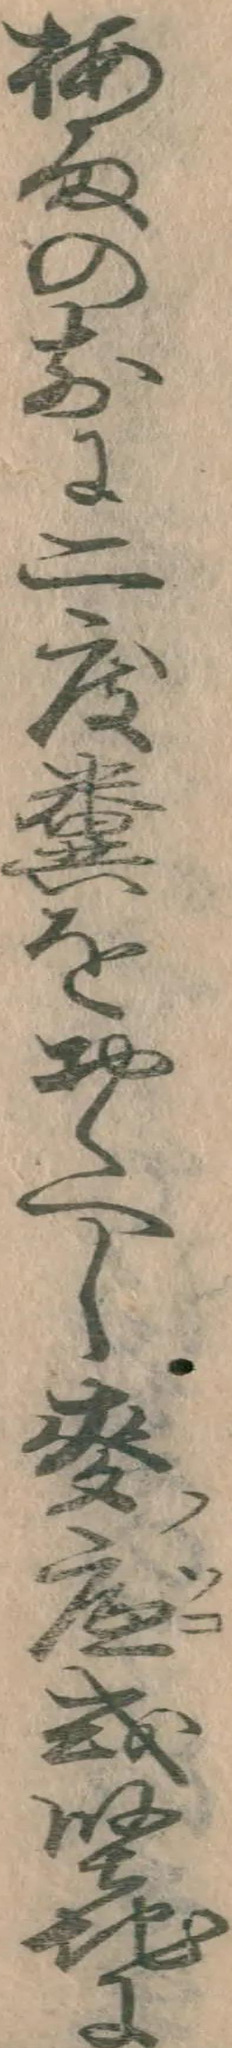梅雨の前に二度糞をおくへし麥底或堅地に
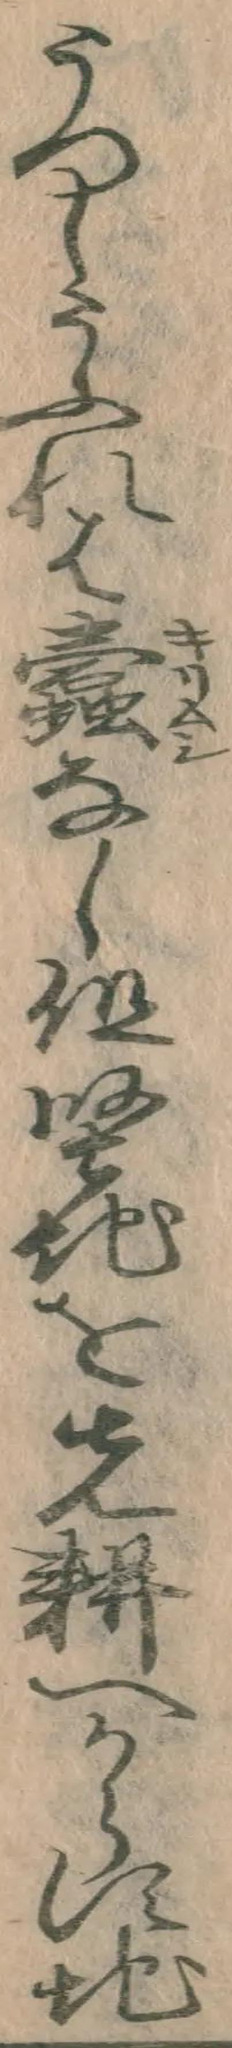うつしうふれは蠧なし但堅地を先耕へからす地
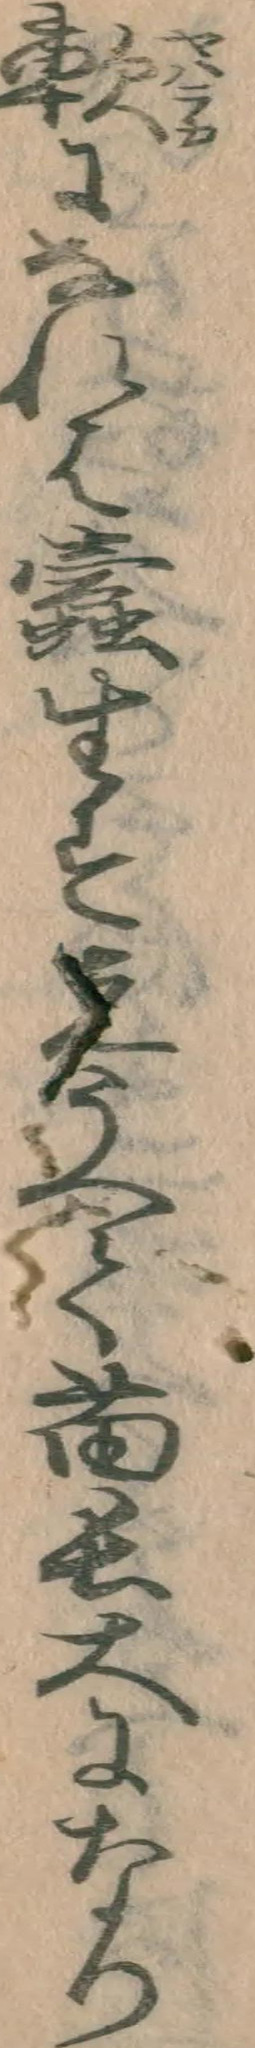軟になれは蠧生す先うへて苗長大になり
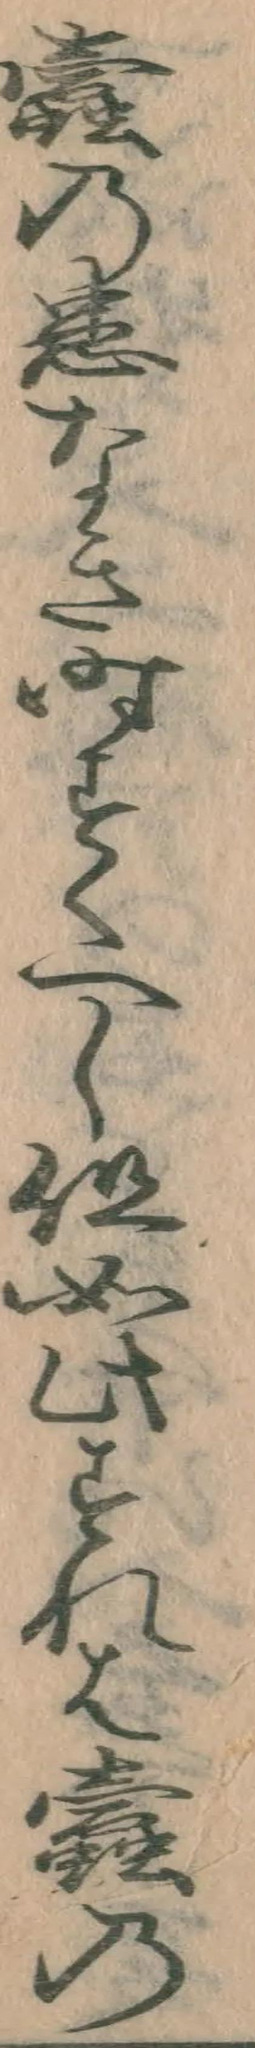蠧の患なき時すくへし但如此すれは蠧の
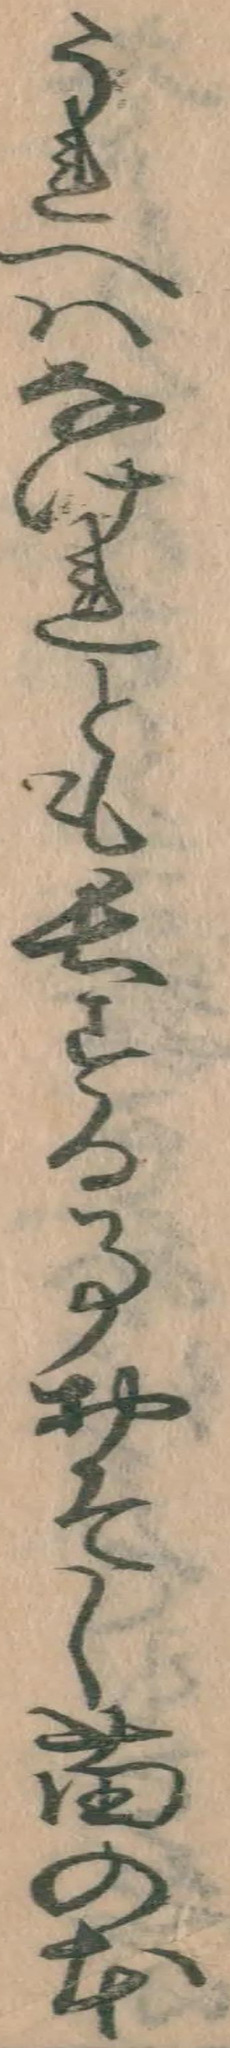うれへはなけれとも長する事おそし苗の本
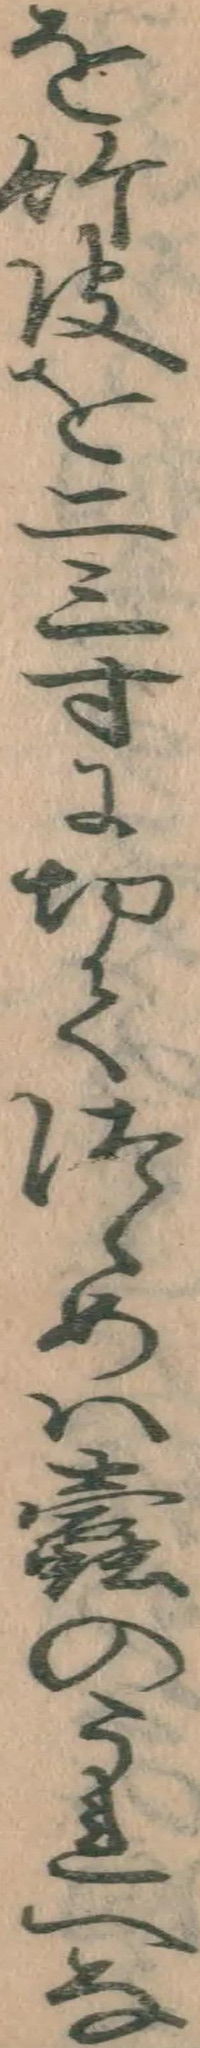を竹皮を二三寸に切てつゝめは蠧のうれへな
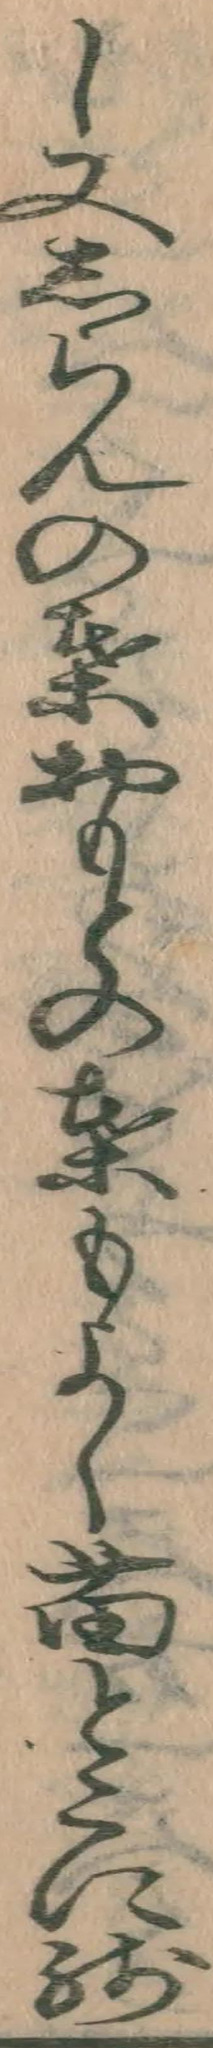し又しらんの葉おもとの葉もよし苗とこに残
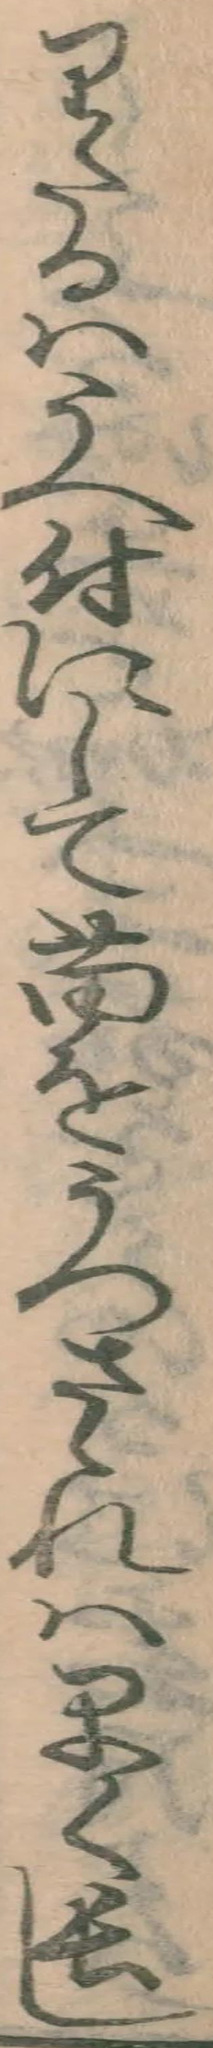りたるはうへ付にして苗をうつさゝれは早く長し
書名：菜譜 3巻
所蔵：国立国会図書館 National Diet Library, JAPAN
